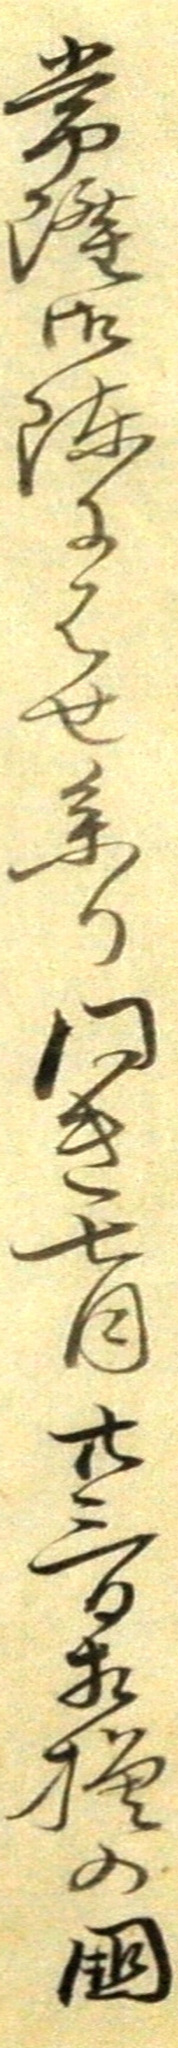常隆御陣にはせ参り同き七月廿三日相模の国
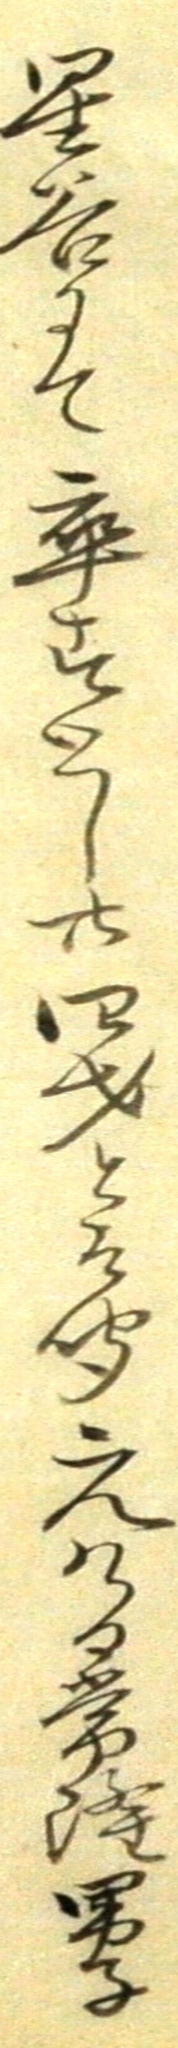星谷にて卒すとし廿四才とそ聞えける常隆男子
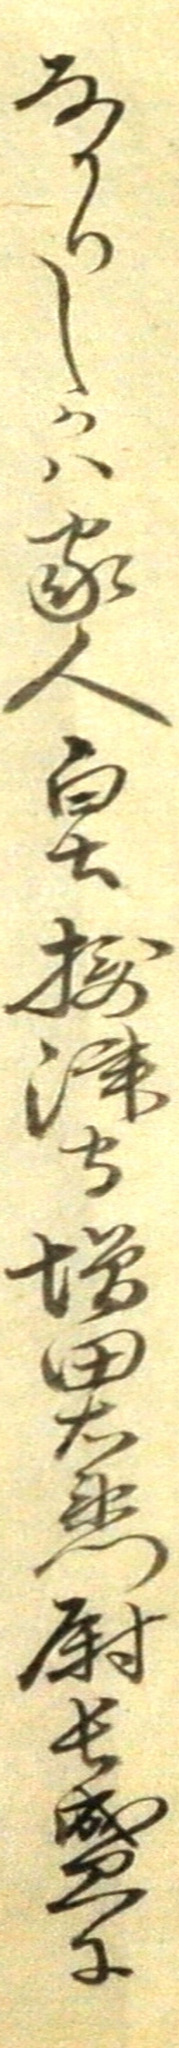なかりしかは家人皁摂津守増田右衛門尉長盛に
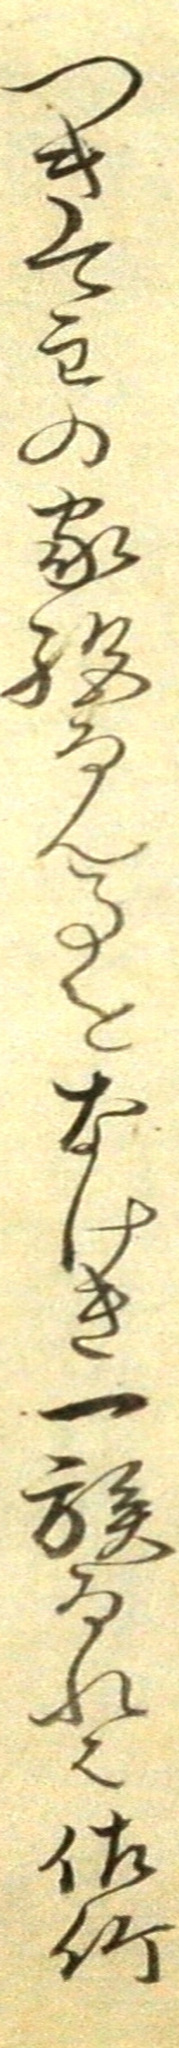つきて主の家絶なん事をなけき一族なれは佐竹
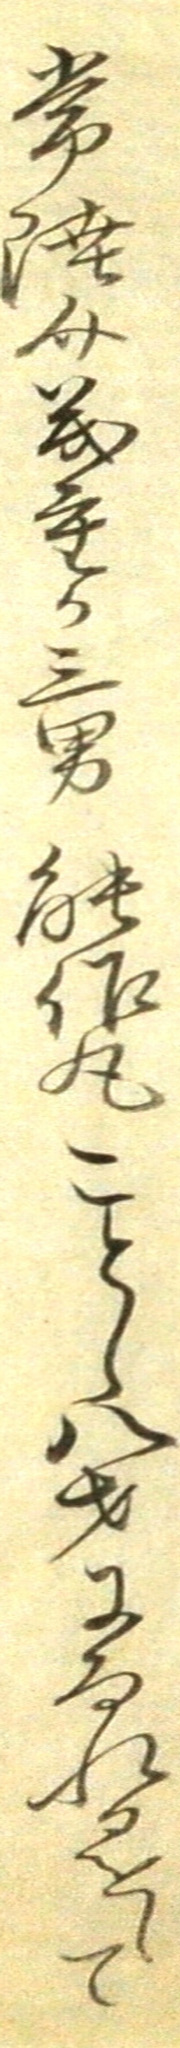常陸介義重か三男能作丸ことし八才になれるをして
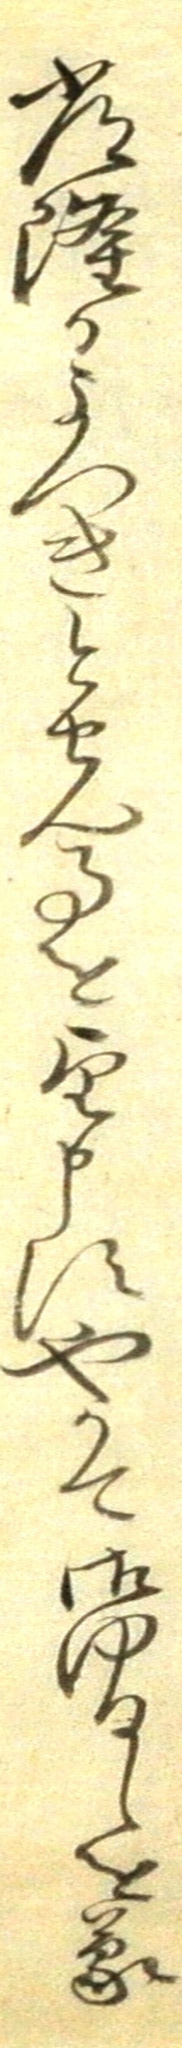常隆かよつきとせん事を望申すやかて御ゆるしを蒙
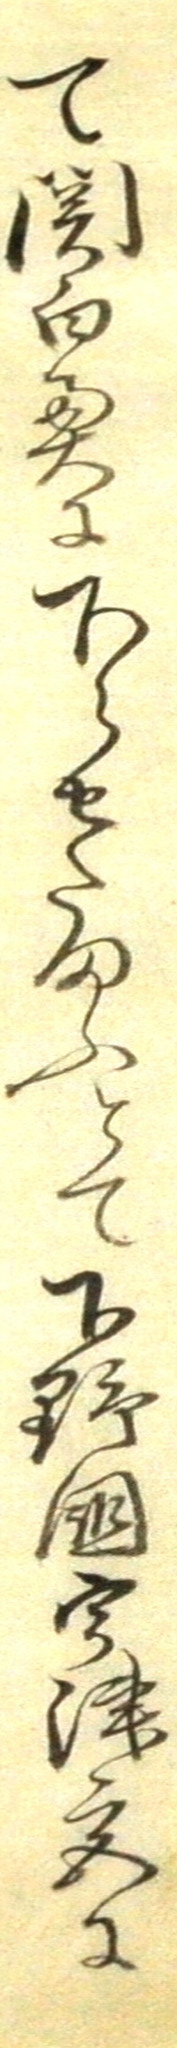て関白奥に下らせたまふとて下野国宇津宮に
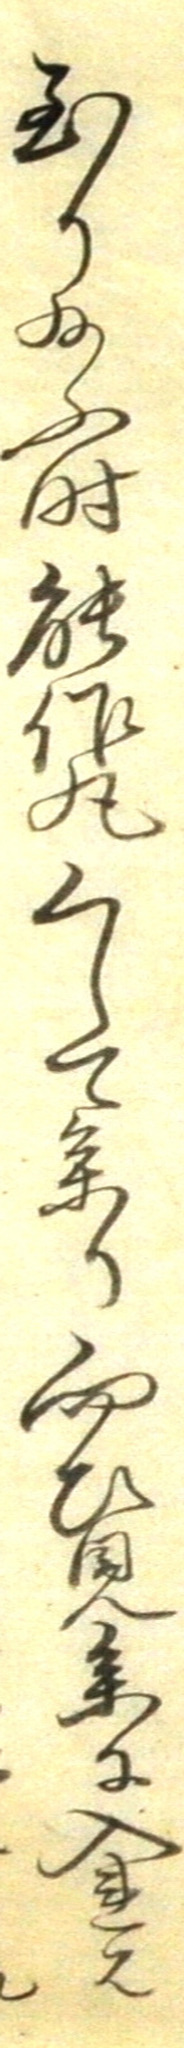至り給ふ時能作丸くして参り向ひ見参に入れは
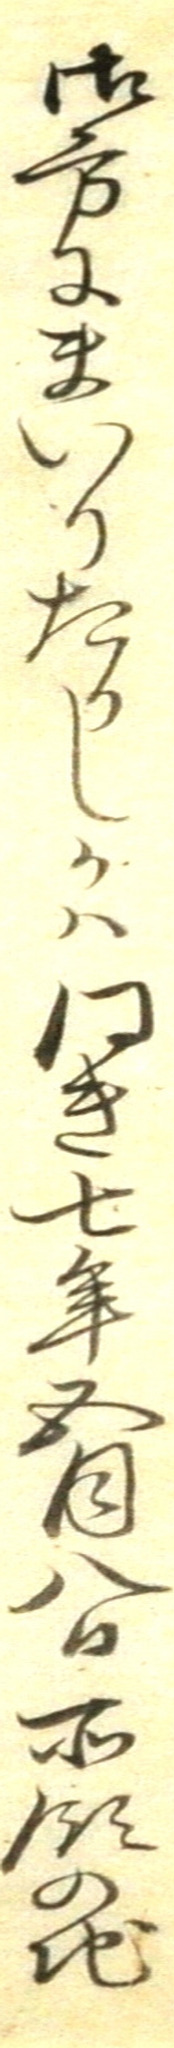御方にまいりたりしかは同き七年五月八日所領の地
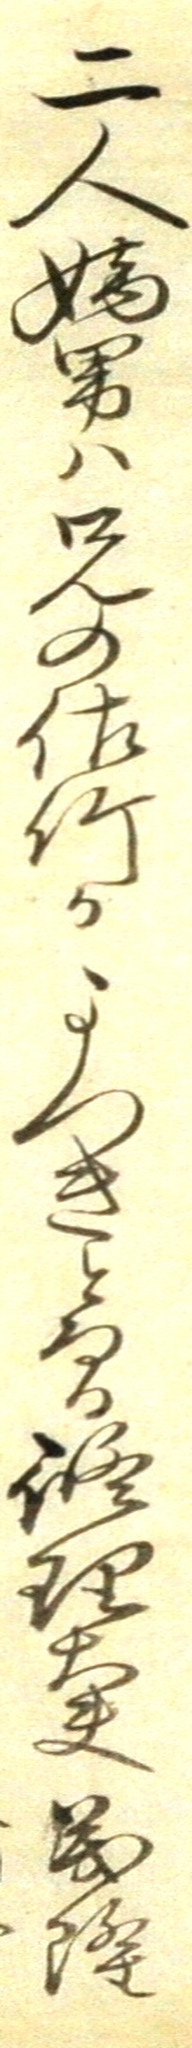二人嫡男は兄の佐竹かよつきとなる修理大夫義隆
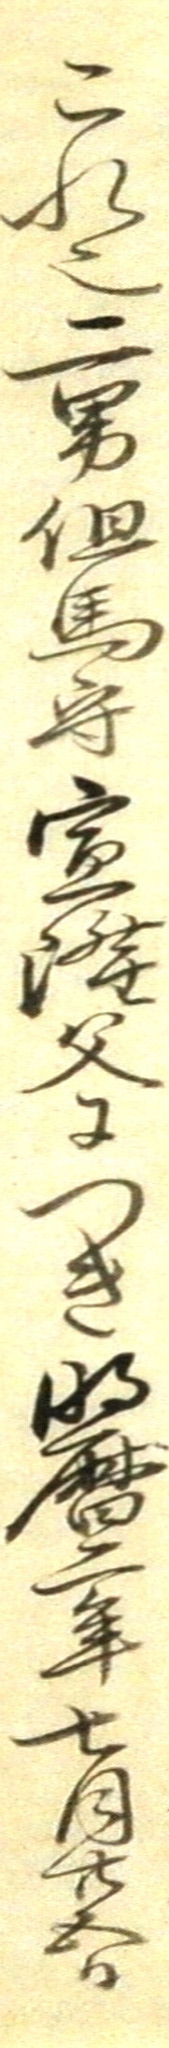これ也二男但馬守宣隆父につき明暦二年七月廿五日
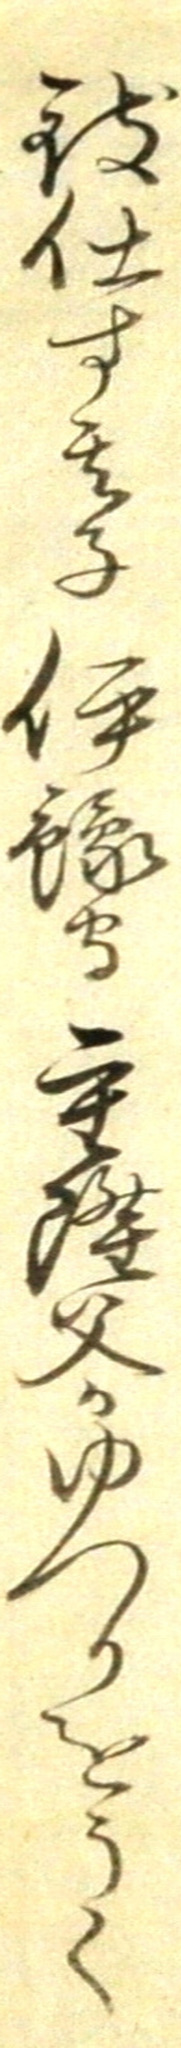致仕す其子伊予守重隆父かゆつりをうく

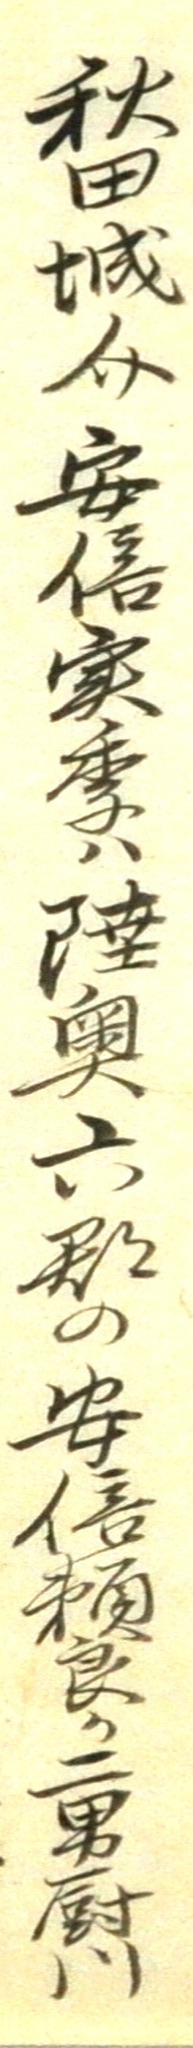秋田城介安倍実季は陸奥六郡の安倍頼良か二男厨川

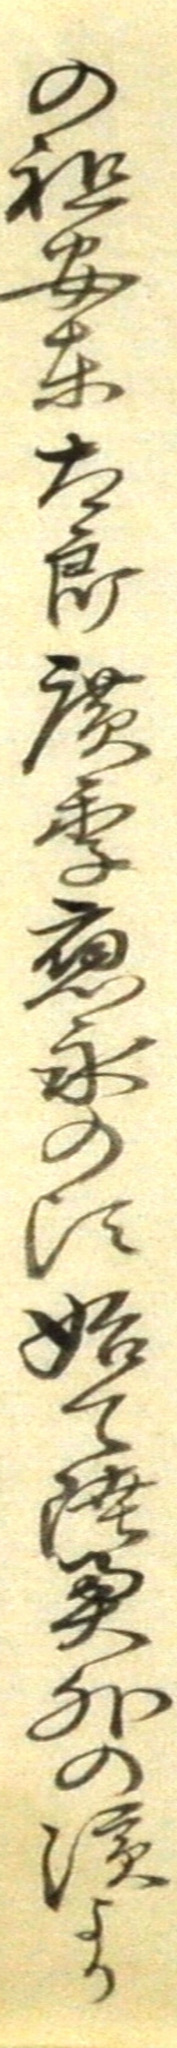の祖安藤太郎広季応永の頃始て陸奥外の浜より
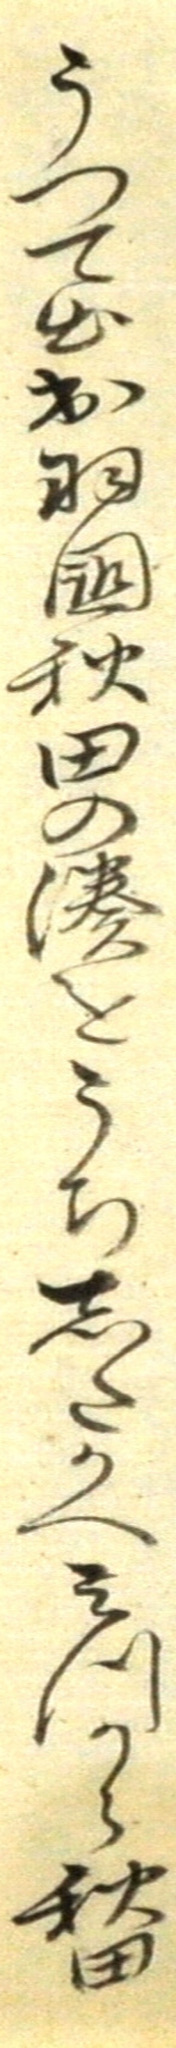うつて出出羽国秋田の湊をうちしたかへみつから秋田
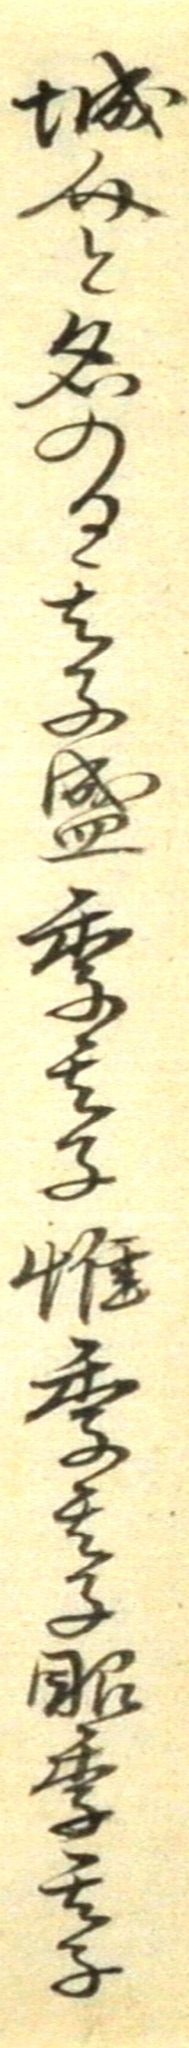城介と名のる其子盛季其子惟季其子昭季其子
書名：藩翰譜（八・下）
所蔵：伊那市立高遠町図書館・合同会社AMANE
